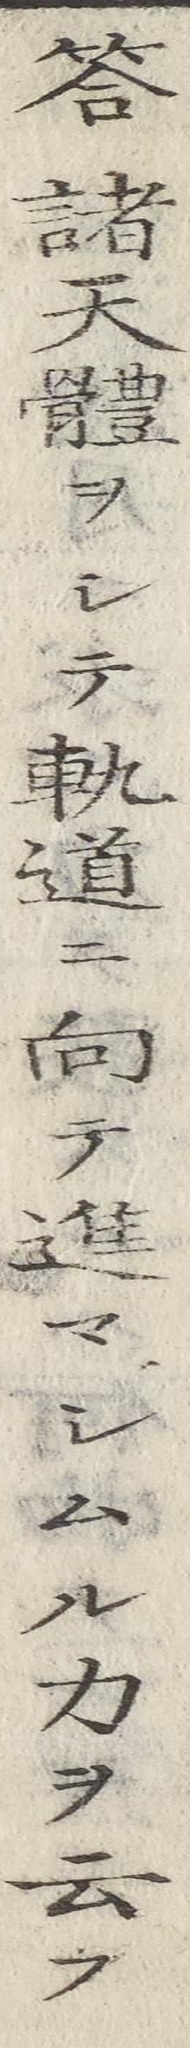答諸天体ヲシテ軌道ニ向テ進マシムル力ヲ云フ
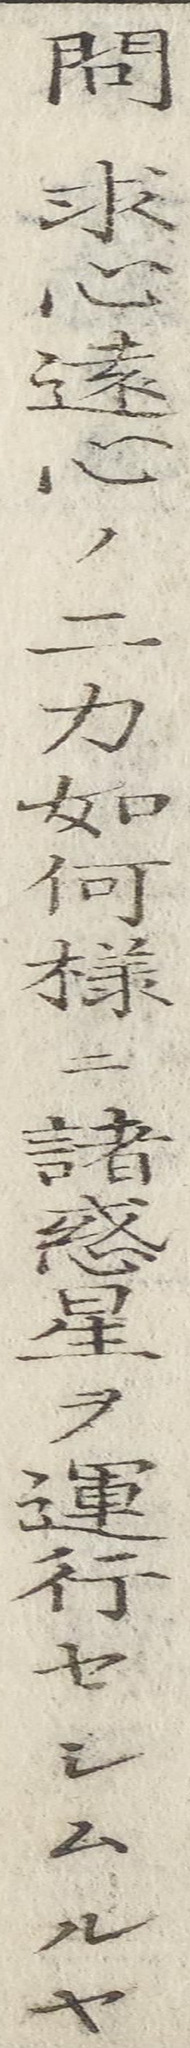問求心遠心ノ二力如何様ニ諸惑星ヲ運行セシムルヤ
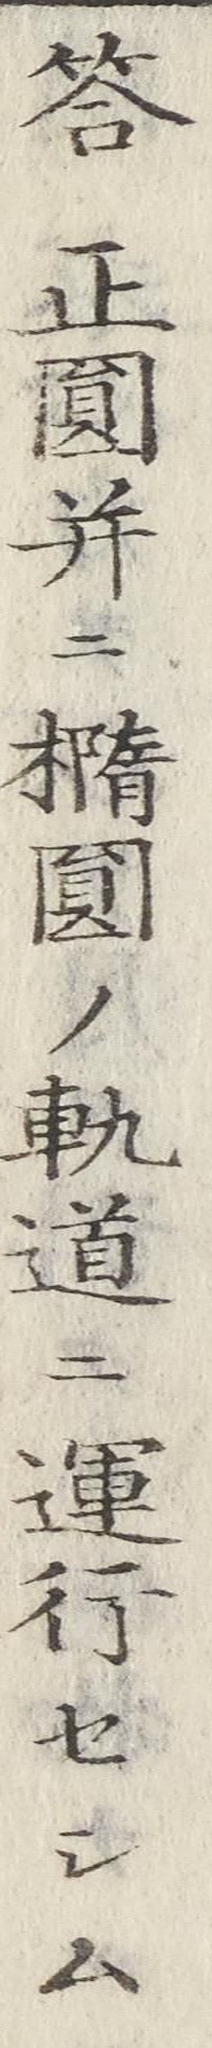答正円幷ニ楕円ノ軌道ニ運行セシム
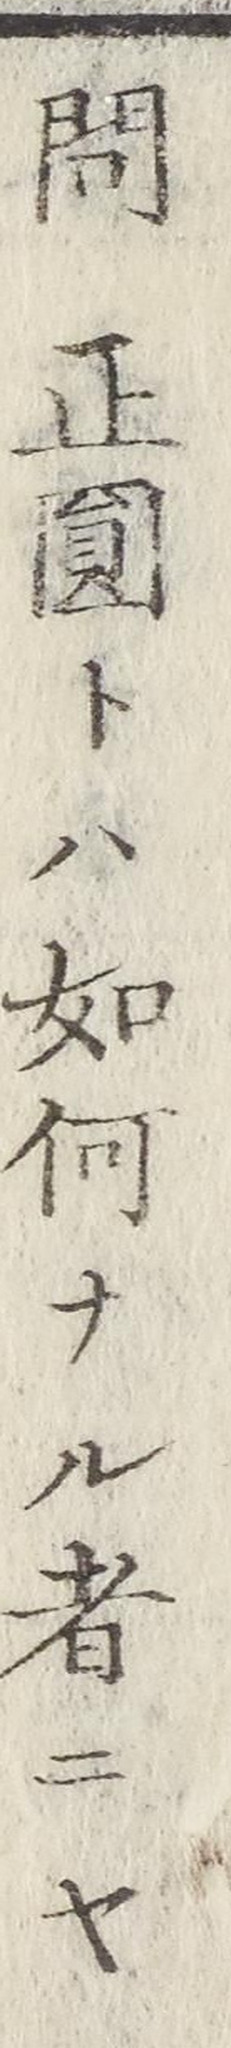問正円トハ如何ナル者ニヤ
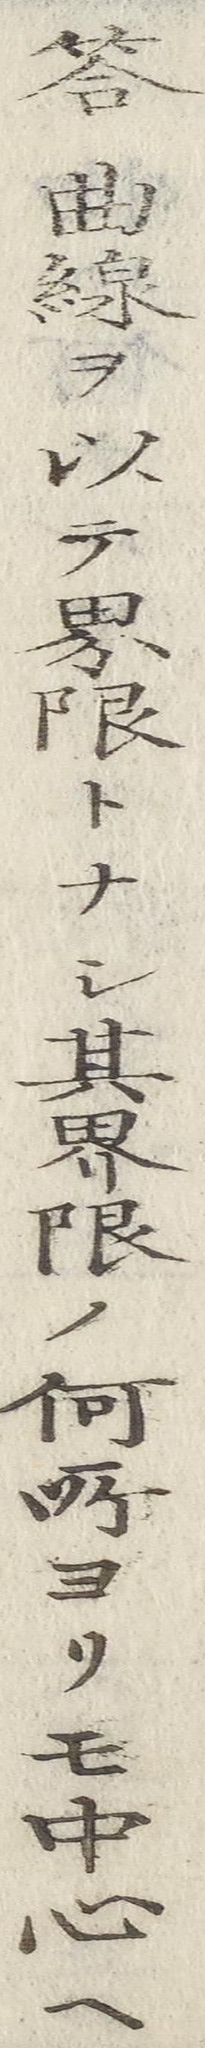答曲線ヲ以テ界限トナシ其界限ノ何所ヨリモ中心ヘ
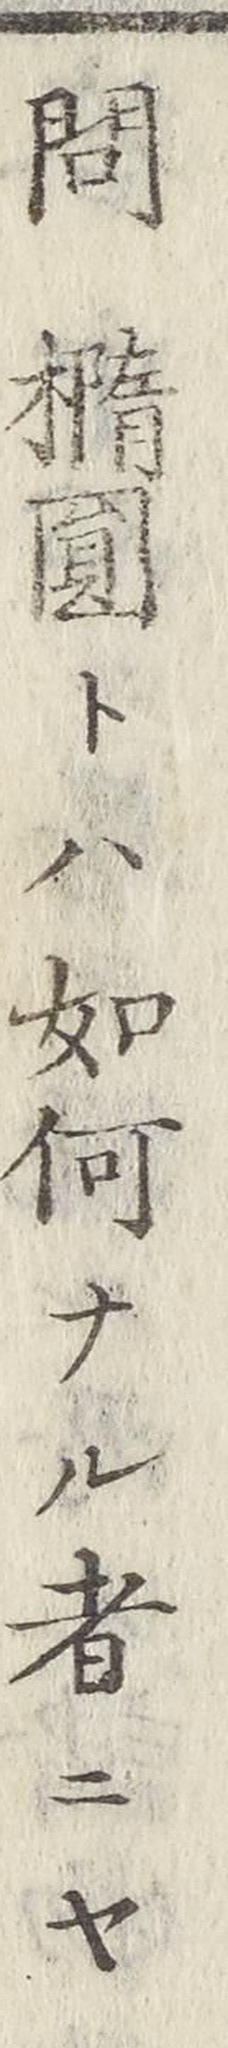問正円トハ如何ナル者ニヤ
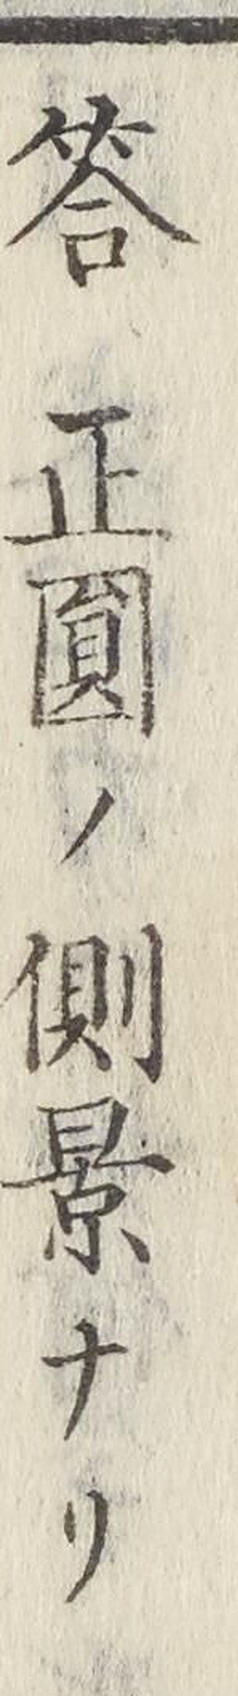答正円ノ側景ナリ
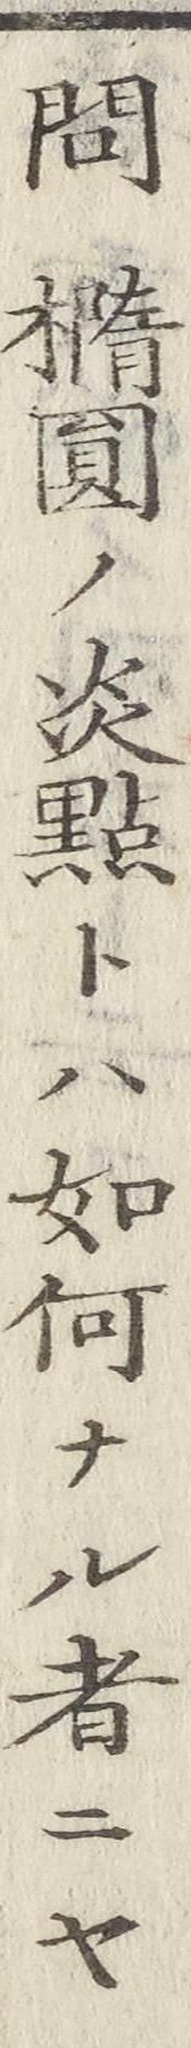問楕円ノ炎点トハ如何ナル者ニヤ
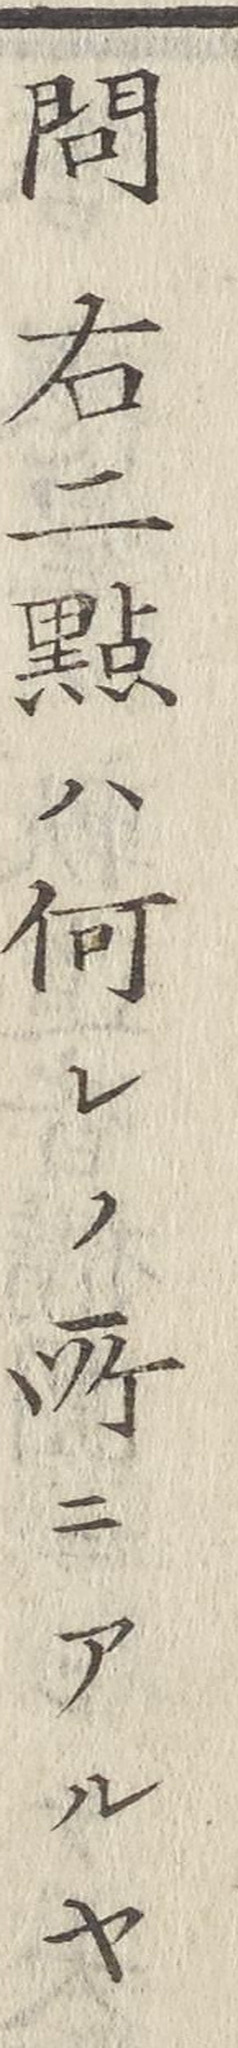問右二点ハ何レノ所ニアルヤ
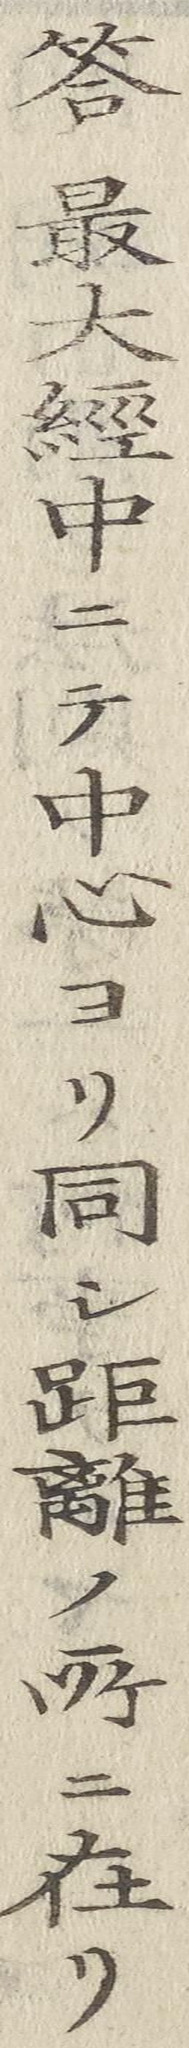答最大経中ニテ中心ヨリ同シ距離ノ所ニ在リ
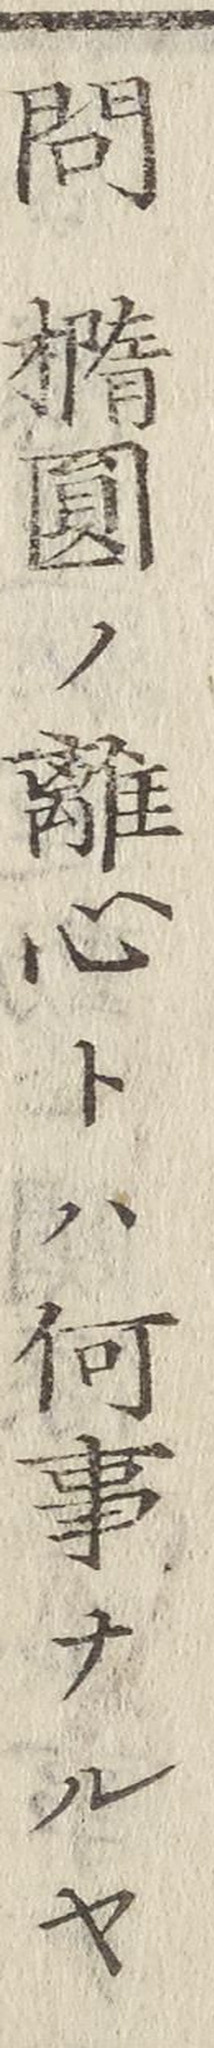問楕円ノ離心トハ何事ナルヤ
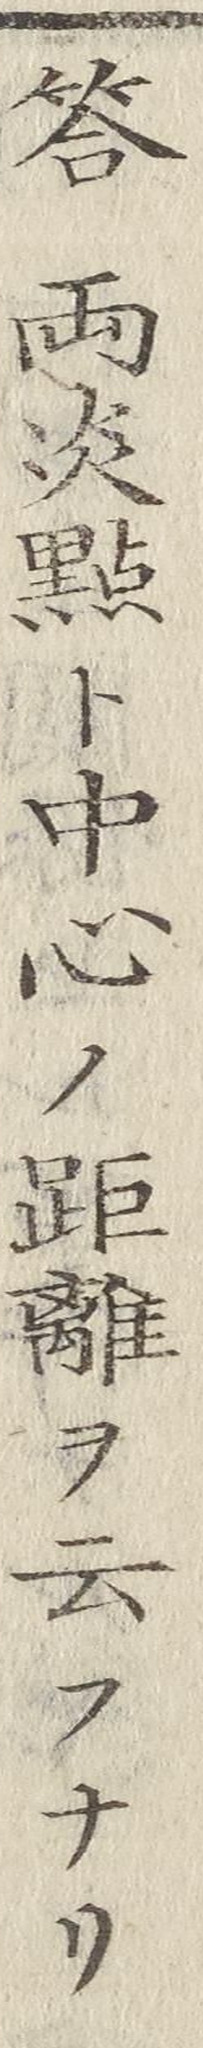答両炎点ト中心ノ距離ヲ云フナリ
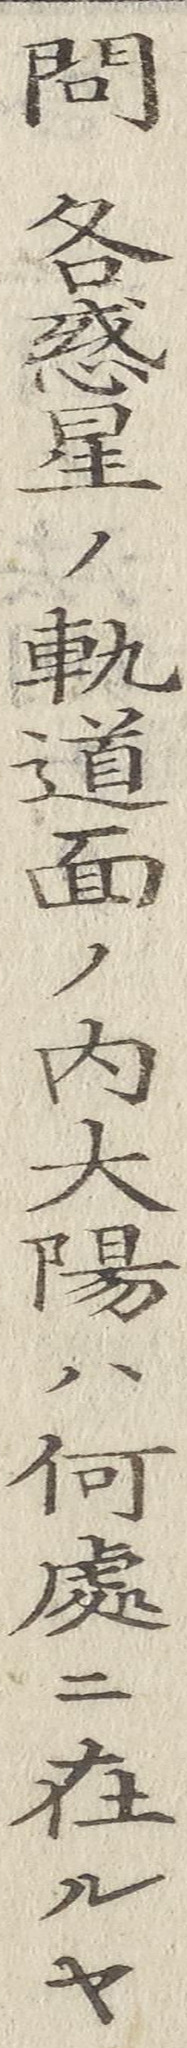問各惑星ノ軌道面ノ内大陽ハ何処ニ在ルヤ
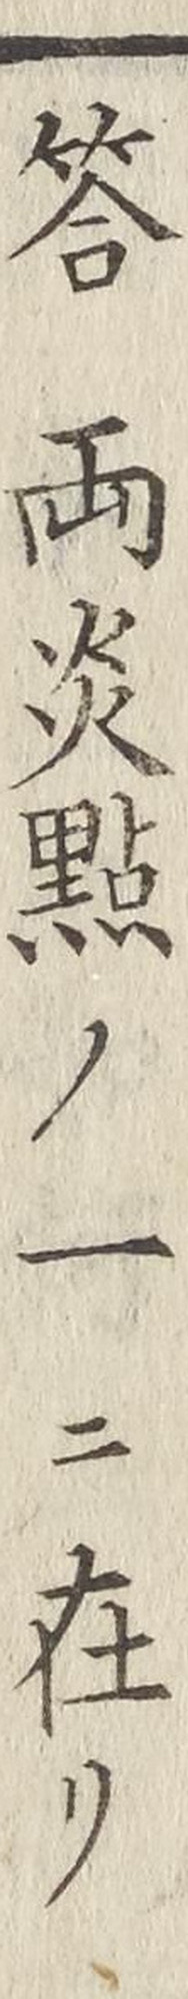答両炎点ノ一ニ在リ
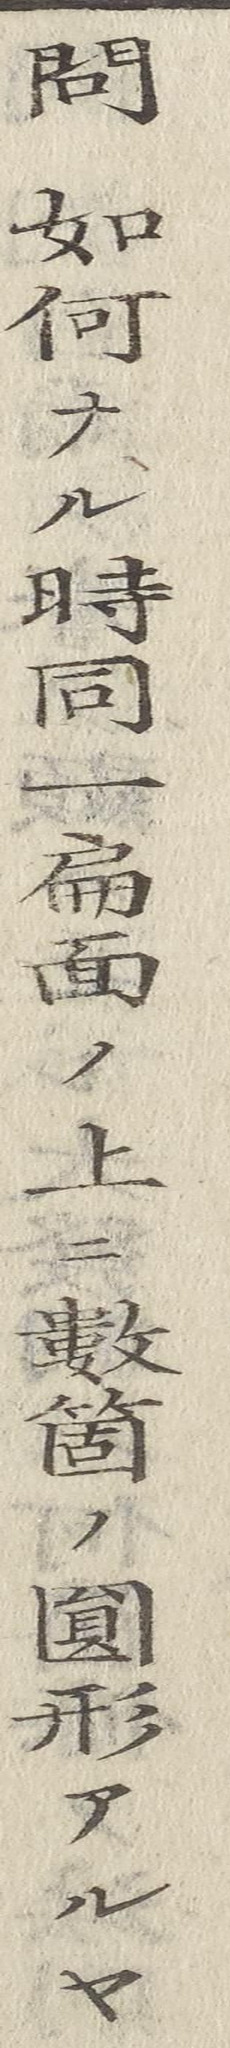問如何ナル時同一扁面ノ上ニ数箇ノ円形アルヤ
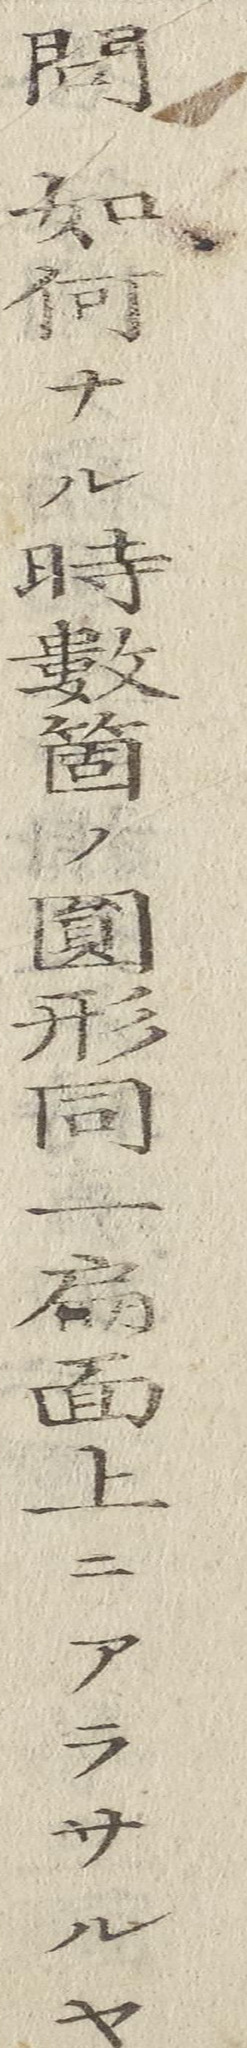問如何ナル時数箇ノ円形同一扁面上ニアラサルヤ
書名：星学圖説　上
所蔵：東京大学地震研究所図書室 Earthquake Research Institute Library, The University of Tokyo, JAPAN
